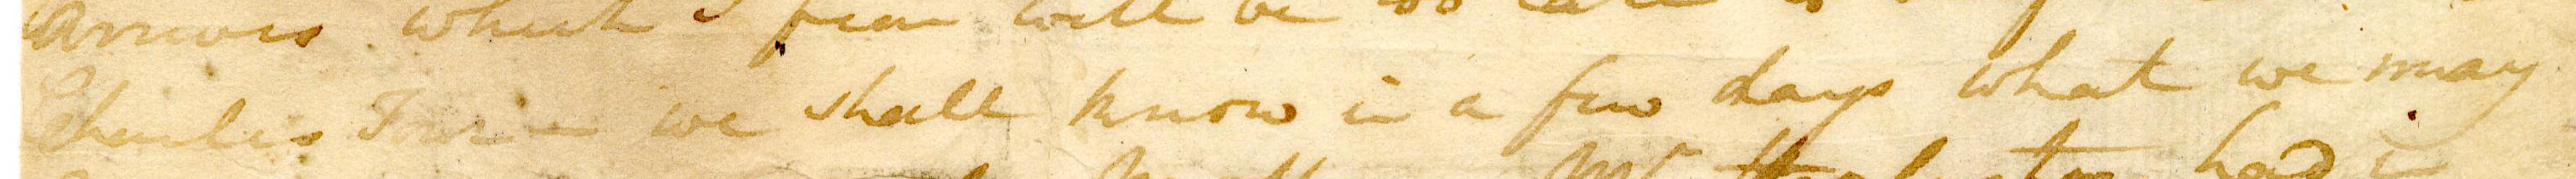Charles Town we shall know in a few days what we may
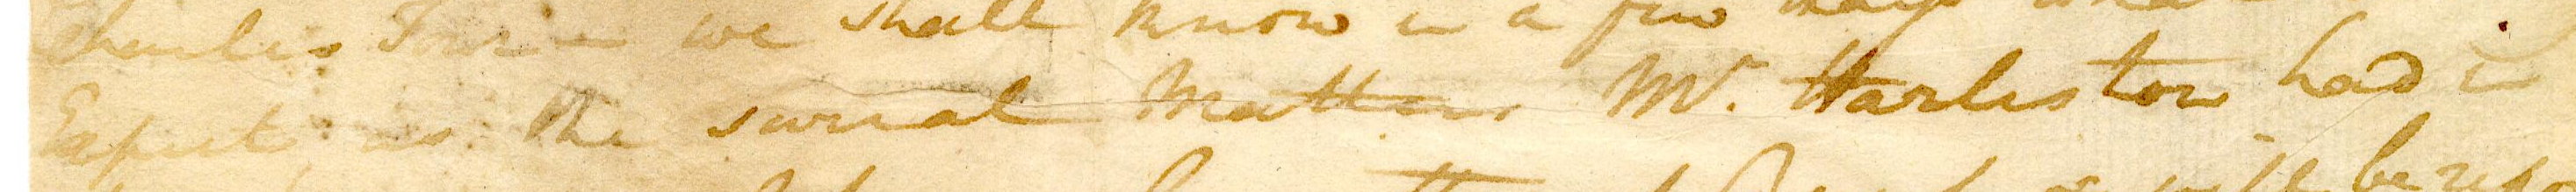Expect on the several Matters M^r. Warlistor had in
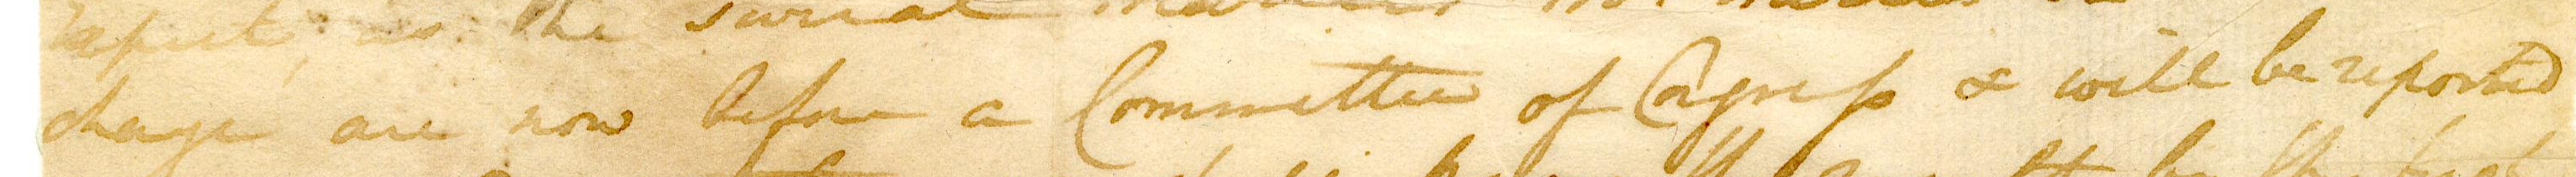charge are now before a Committee of Congress & will be reported
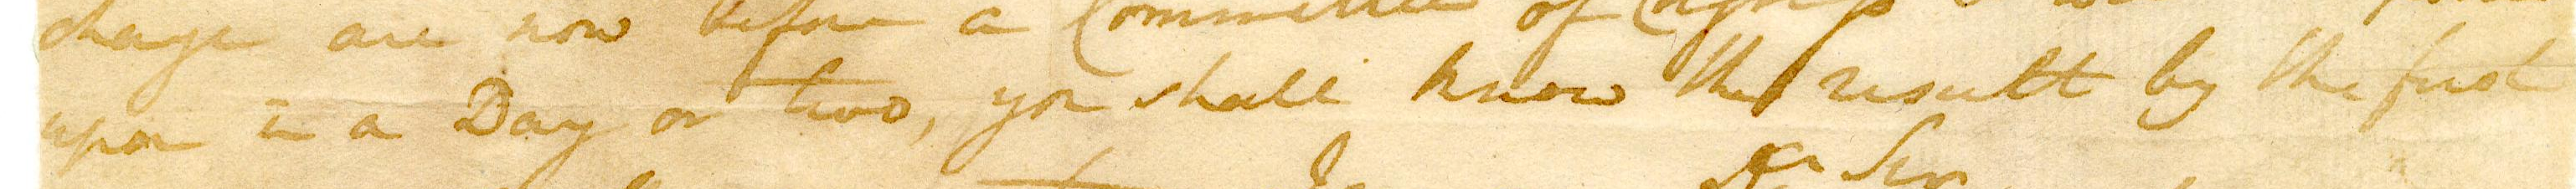upon in a Day or Two, you shall know the result by the first
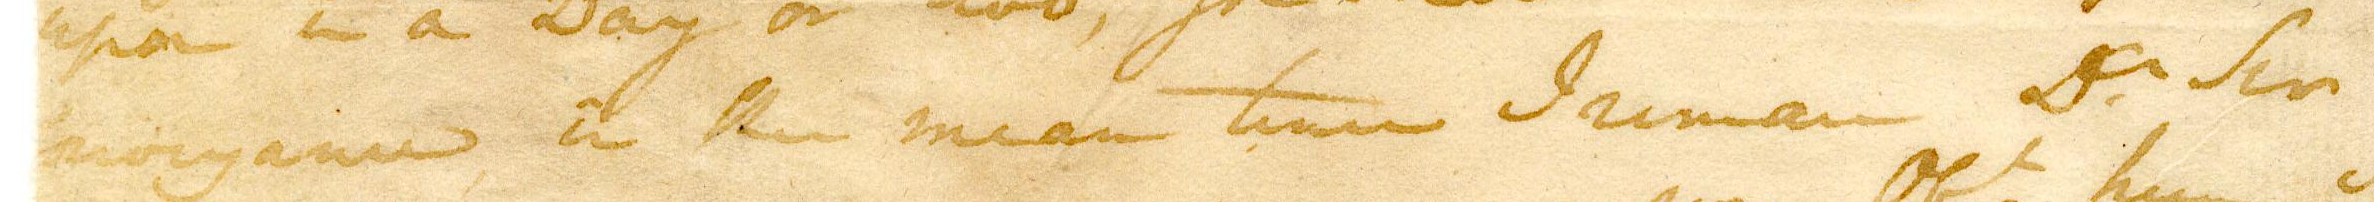Conveyance in the mean time I remain D^r. Sir
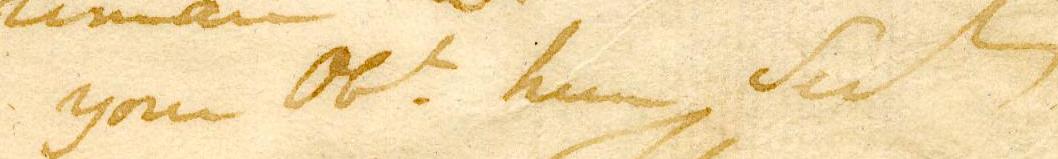Your Ob^t. hum Ser^t
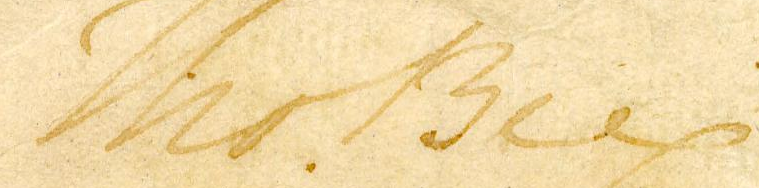Tho. Bee
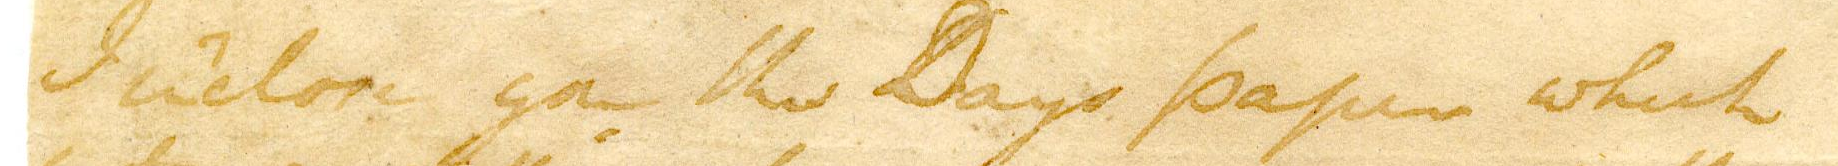Inclose you the Days paper which
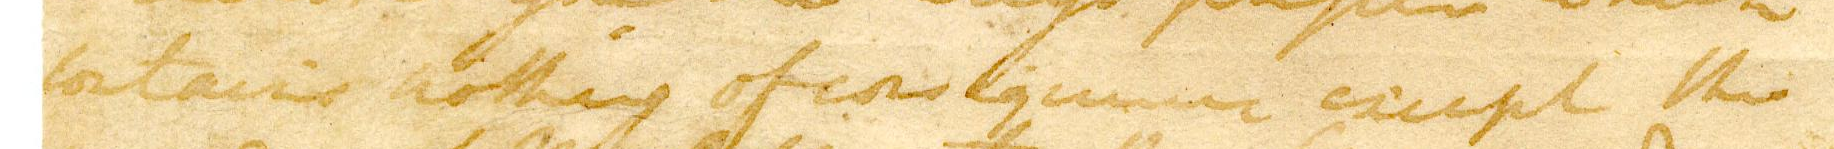contains nothing of consequence except the
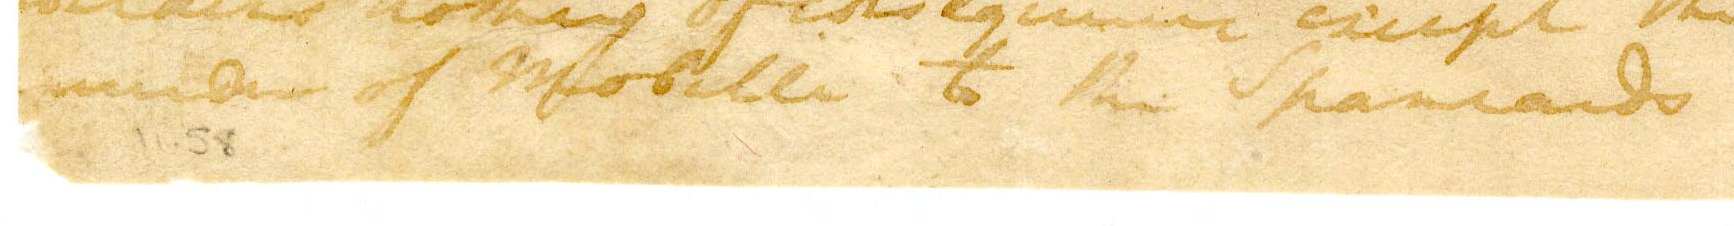surrender of Mobilla to the Spaniards
